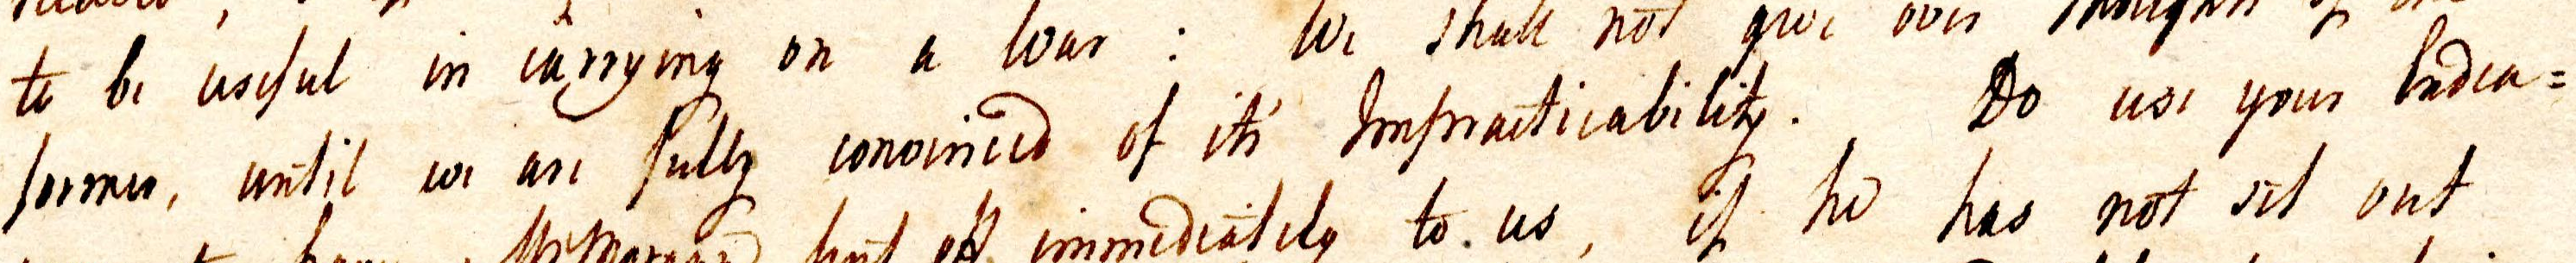former, until we are fully convinced of its Impracticability. Do use your Endea-
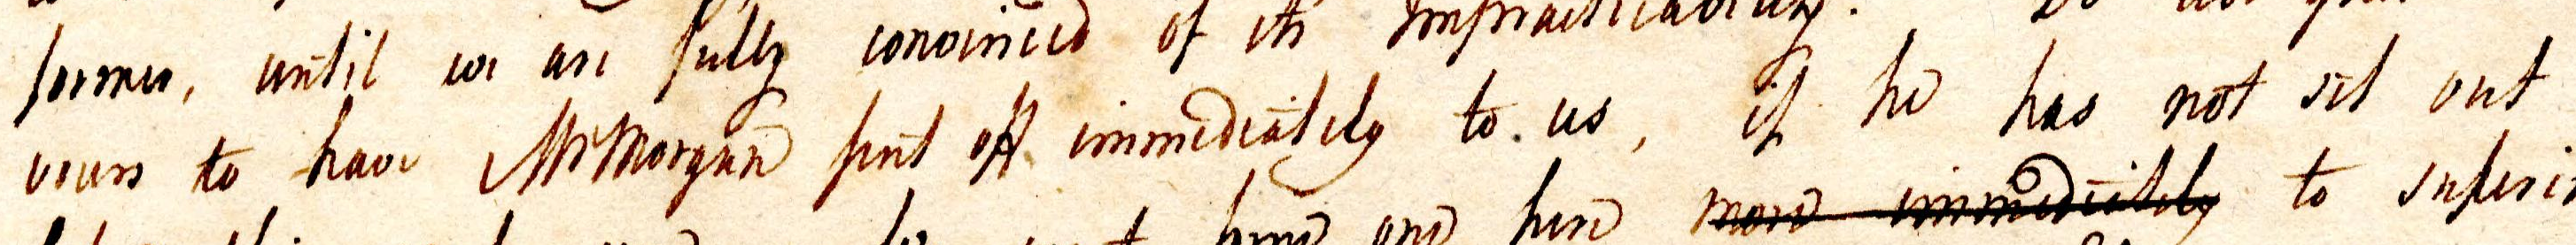vours to have M^r Morgan sent off immediately to us, if he has not set out
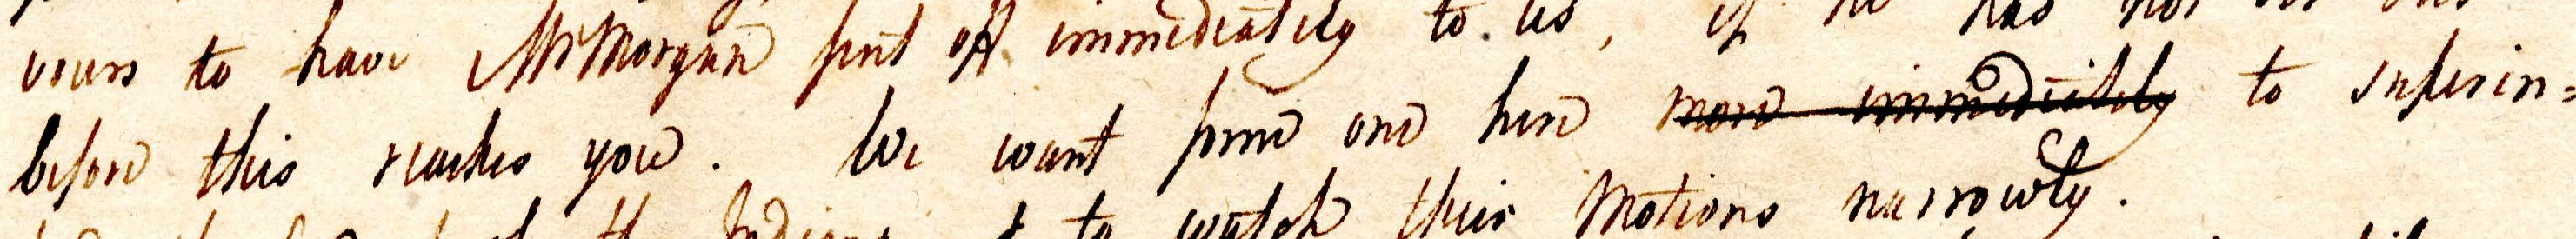before this reaches you. We want some one here more immediately to superin-
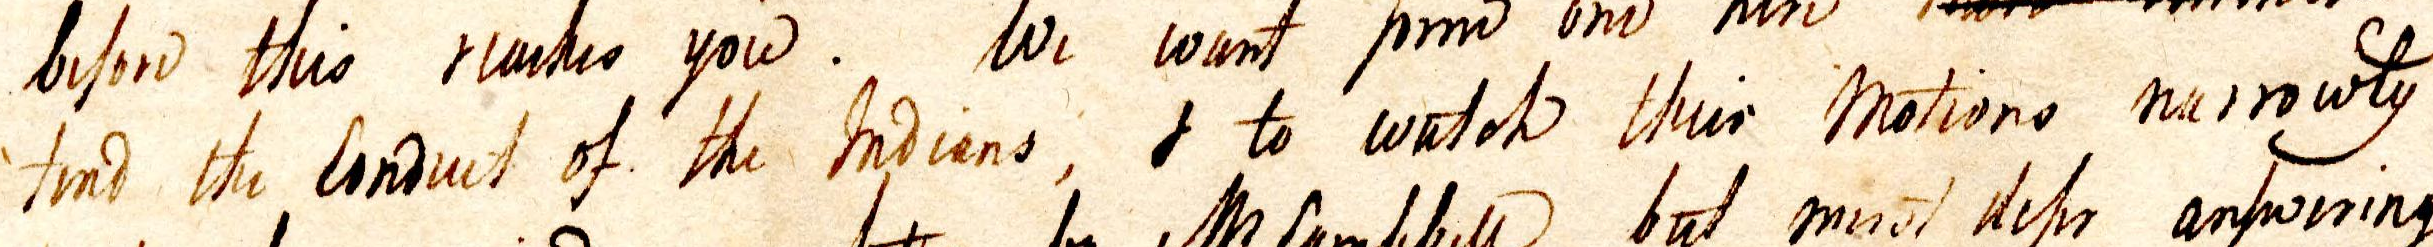tend the Conduct of the Indians, & to watch their Motions narrowly.
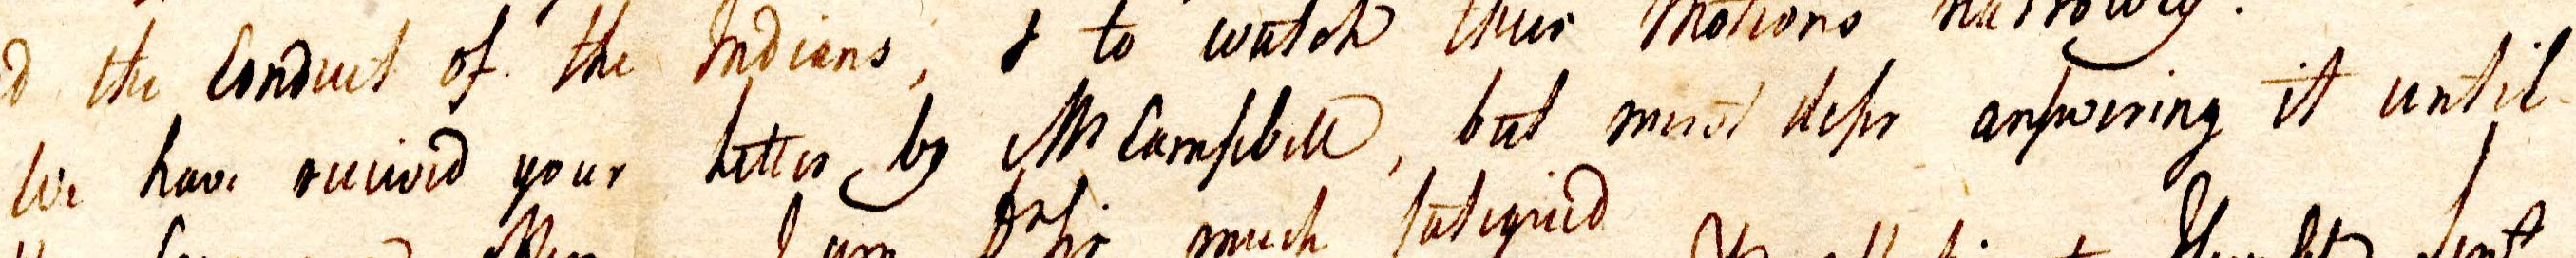We have received your Letter, by M^r Campbell, but must defer answering it until
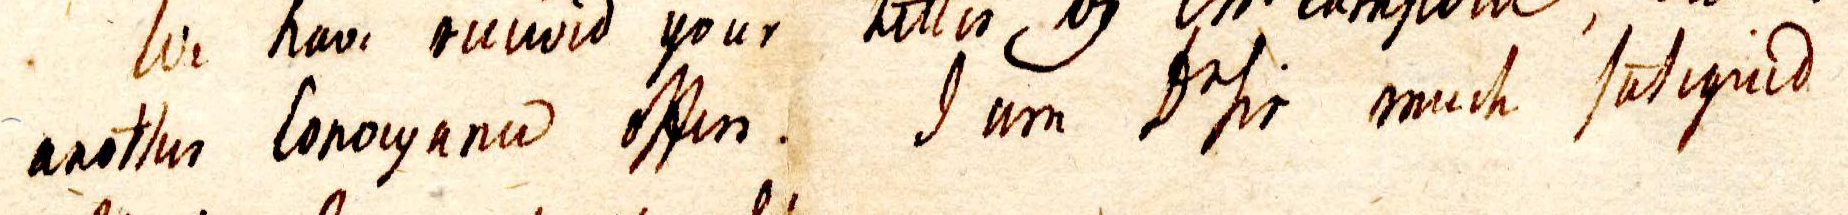another Conveyance offers. I am D^r Sir much Intrigued
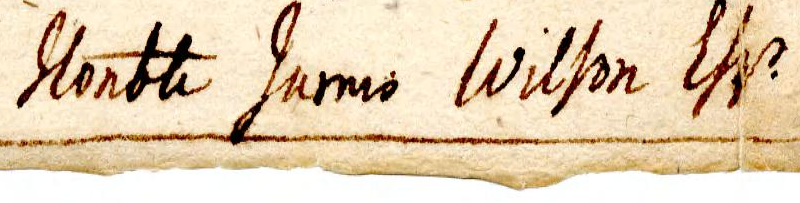Honble James Wilson Esq^e
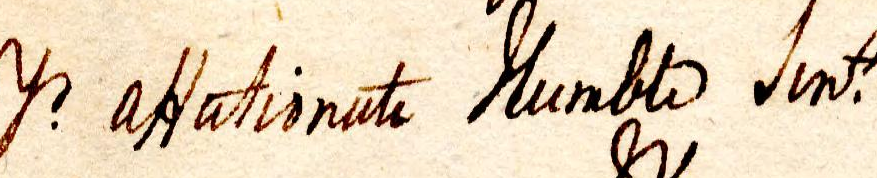Y^r affectionate Humble Ser^t.
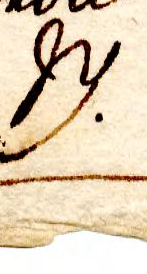JY.
